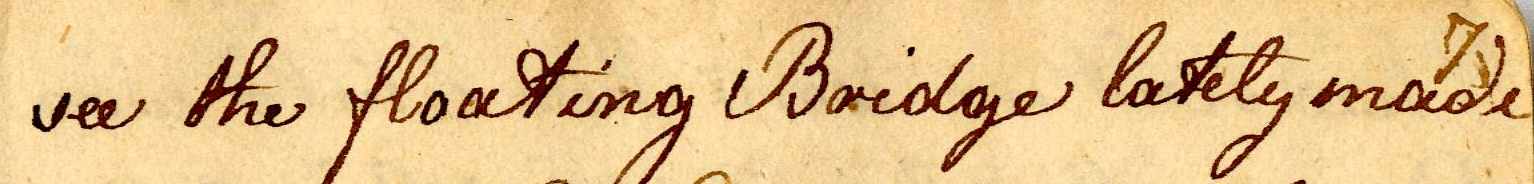see the floating Bridge lately made
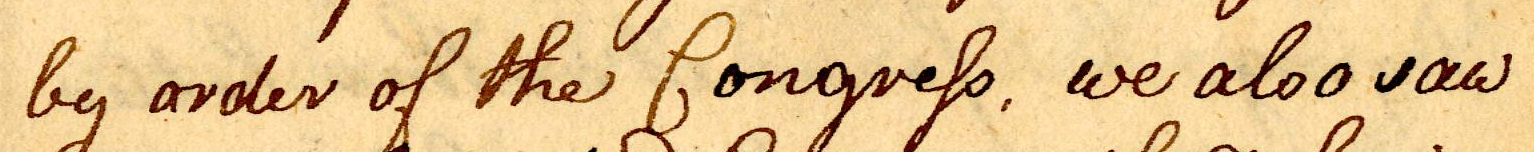by order of the Congress, we also saw
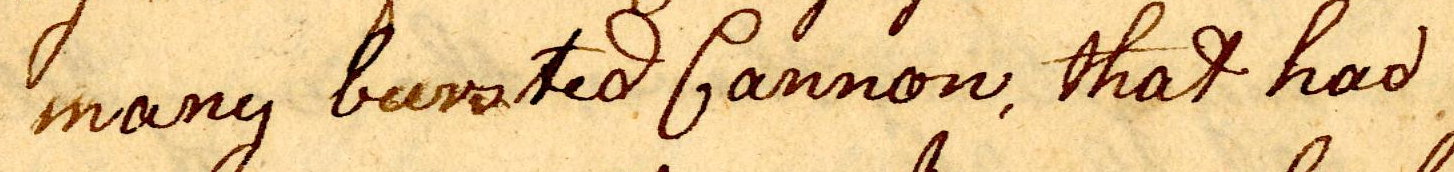many bursted Cannon, that had
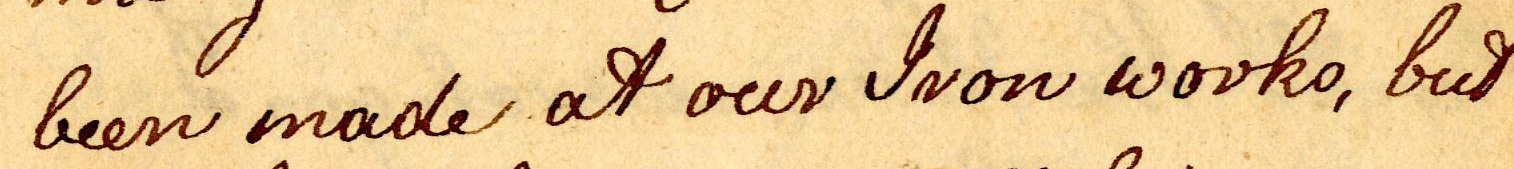been made at our Iron works, but
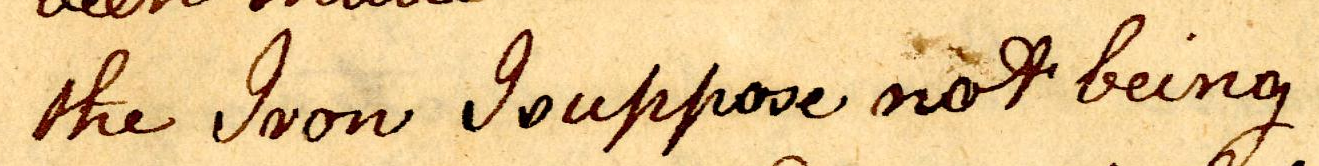the Iron I suppose not being
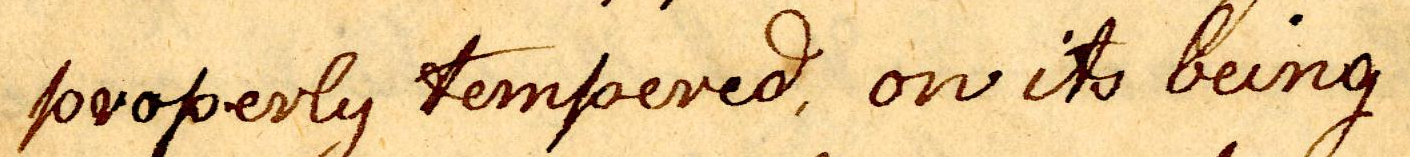properly tempered, on its being
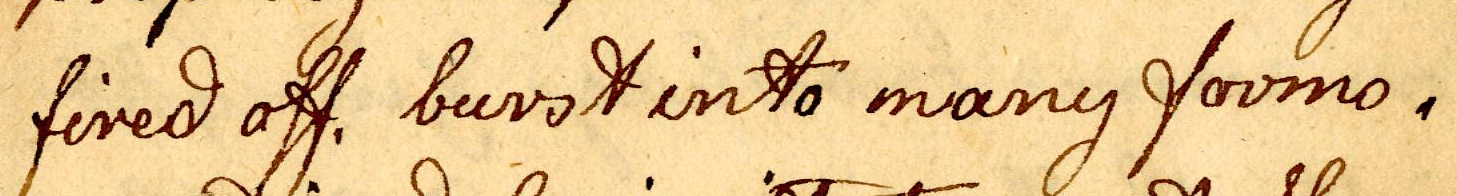fired off, burst into many forms.
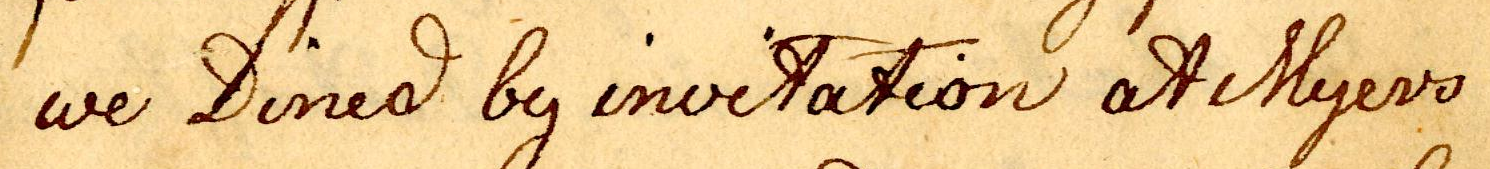we Dined by invitation at Myers
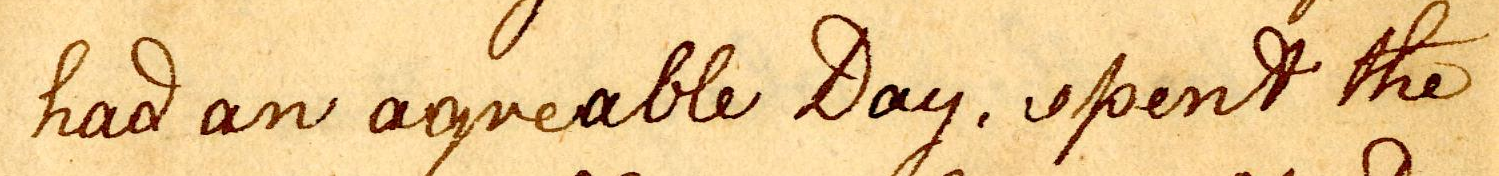had an agreable Day. spent the
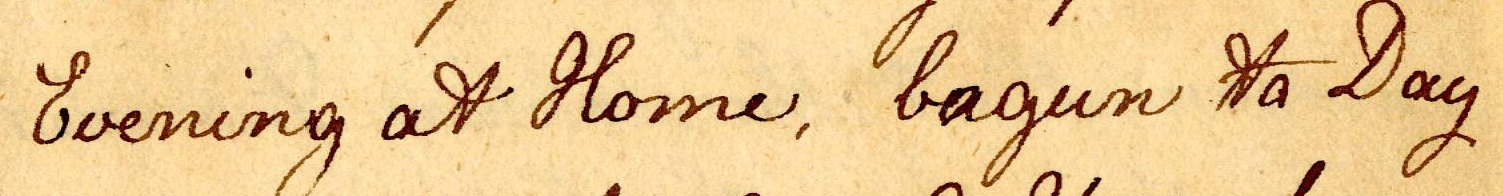Evening at Home, bagun to Day
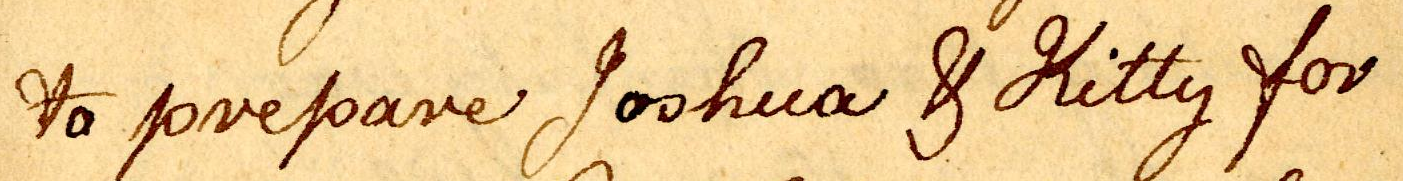to prepare Joshua & Kitty for
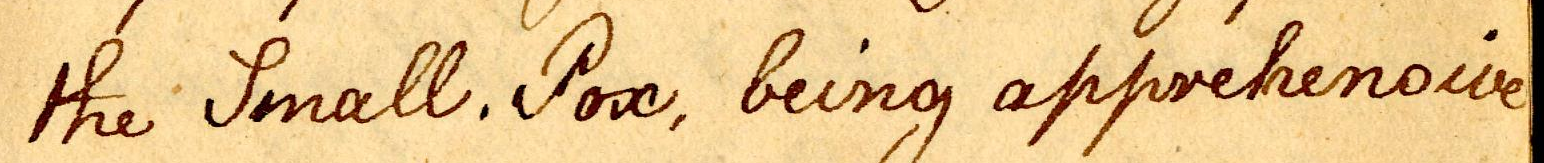the Small Pox, being apprehensive
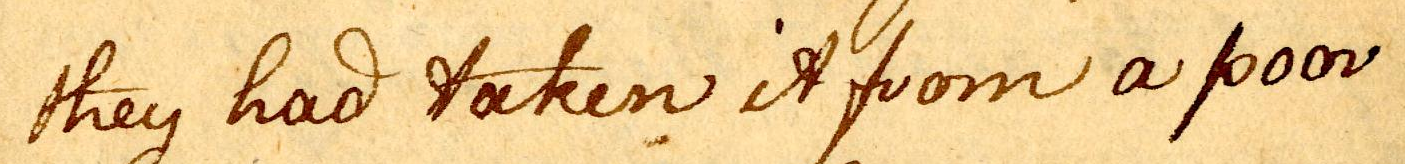they had taken it from a poor
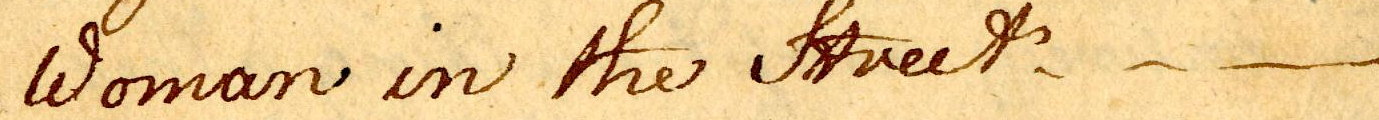Woman in the Street -
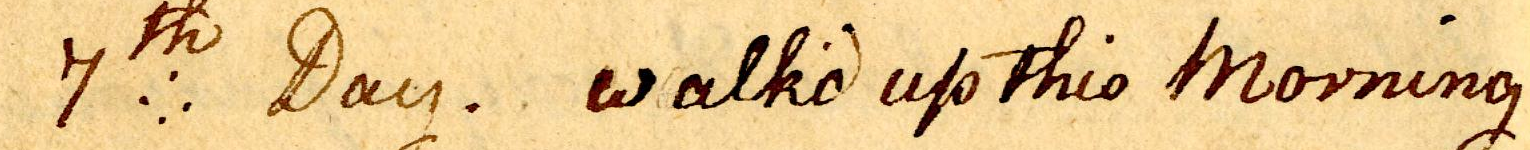7^th Day. walk'd up this morning
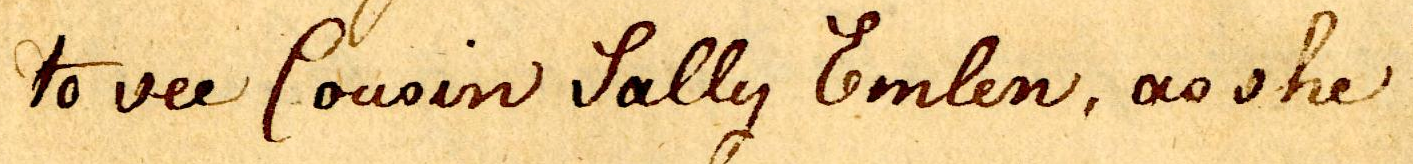to see Cousin Sally Emlen, as she
